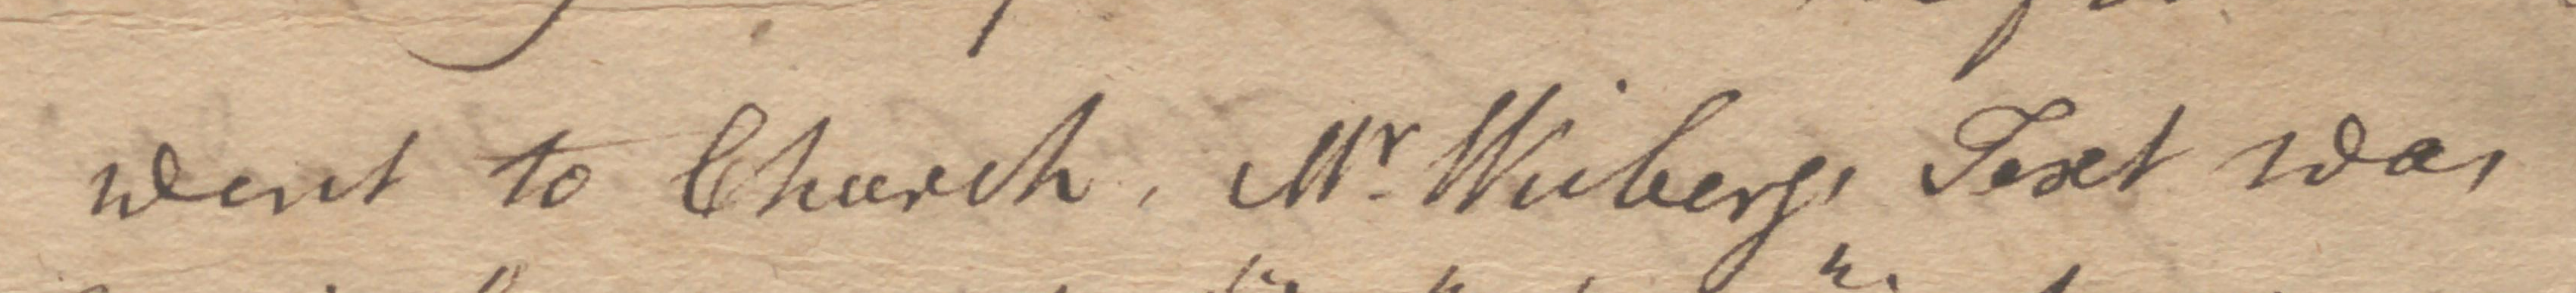went to Church, M^r. Weibergs Text was
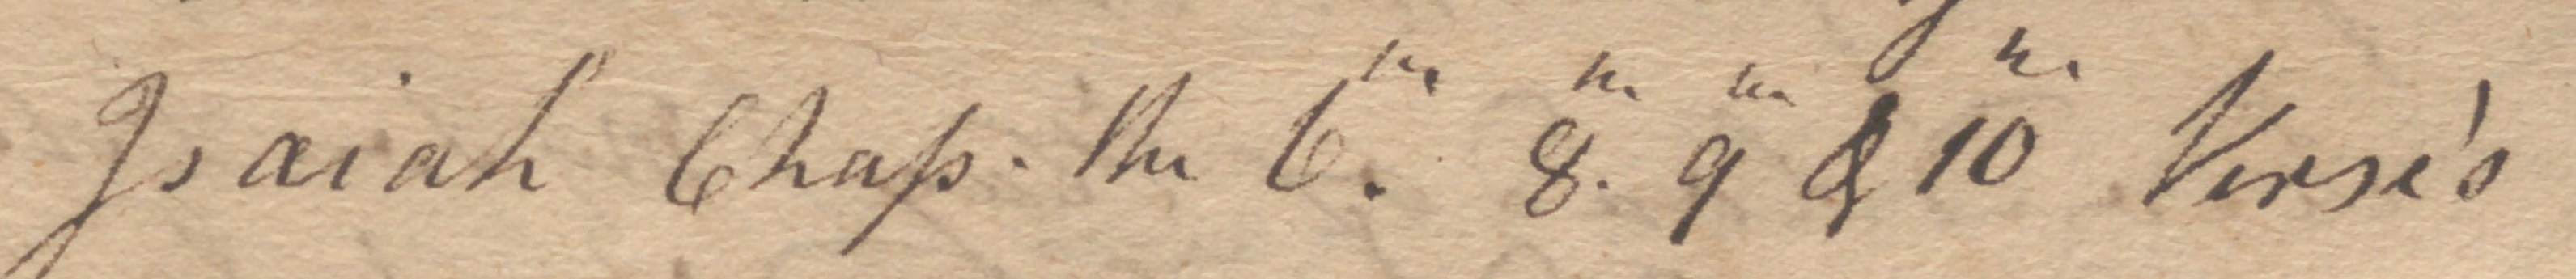Isaiah Chap. the 6^th. 8^th. 9^th & 10^th Verse's
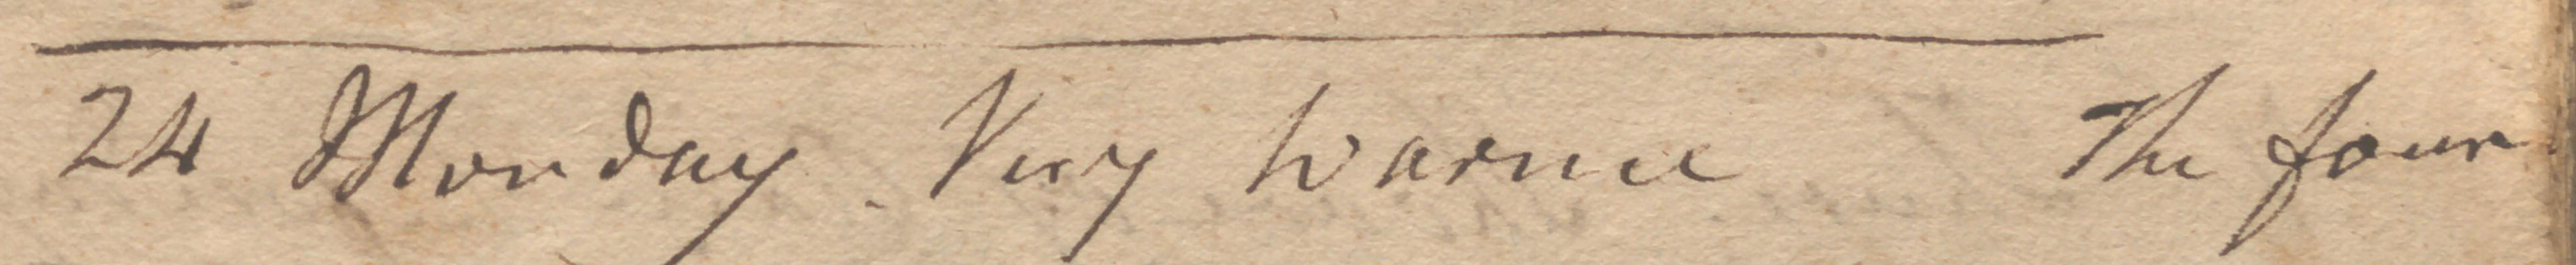24 Monday Very warme The four
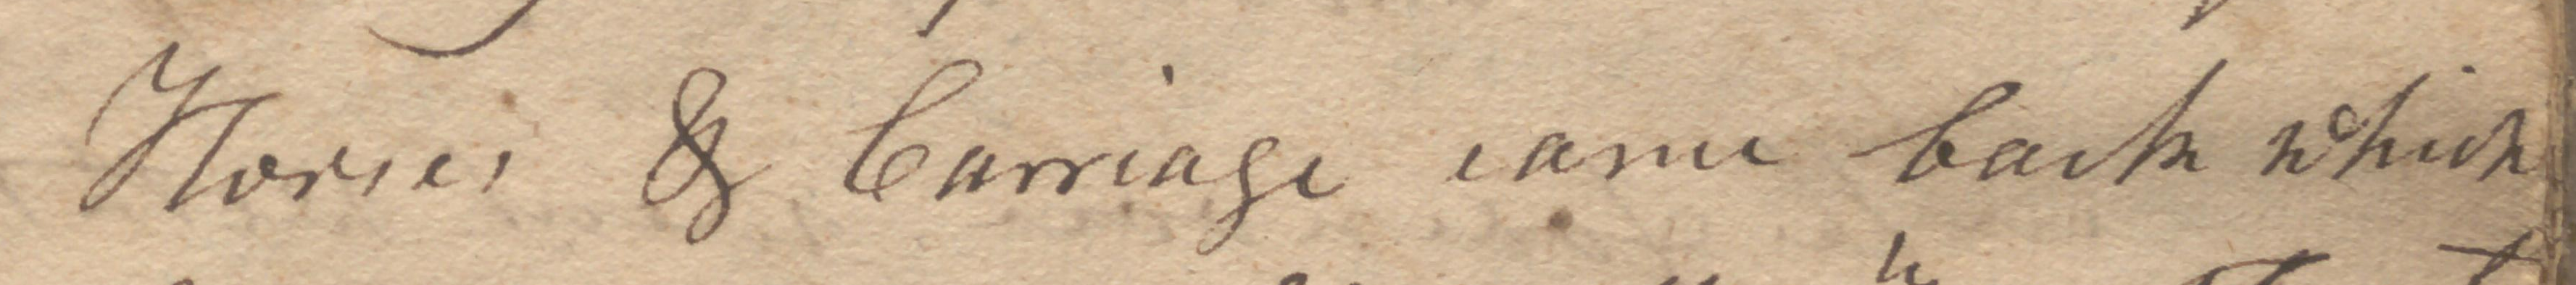Horses & Carriage came back which
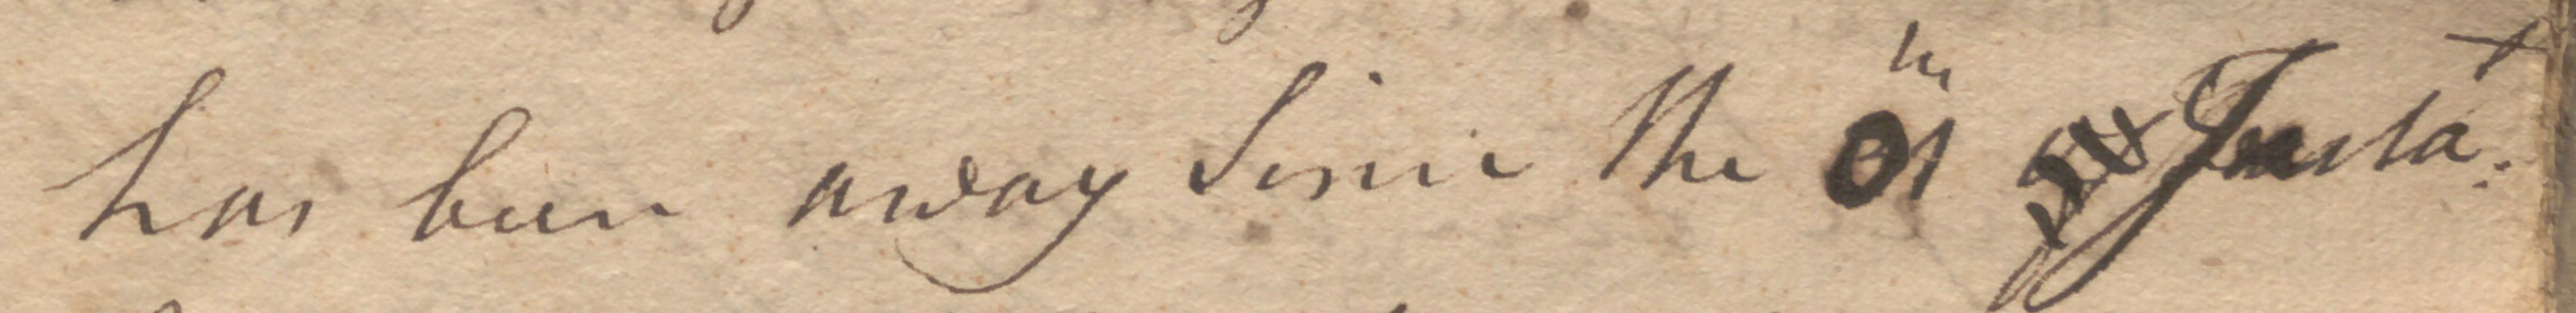has been away since the 01^th [of] Insta^t:
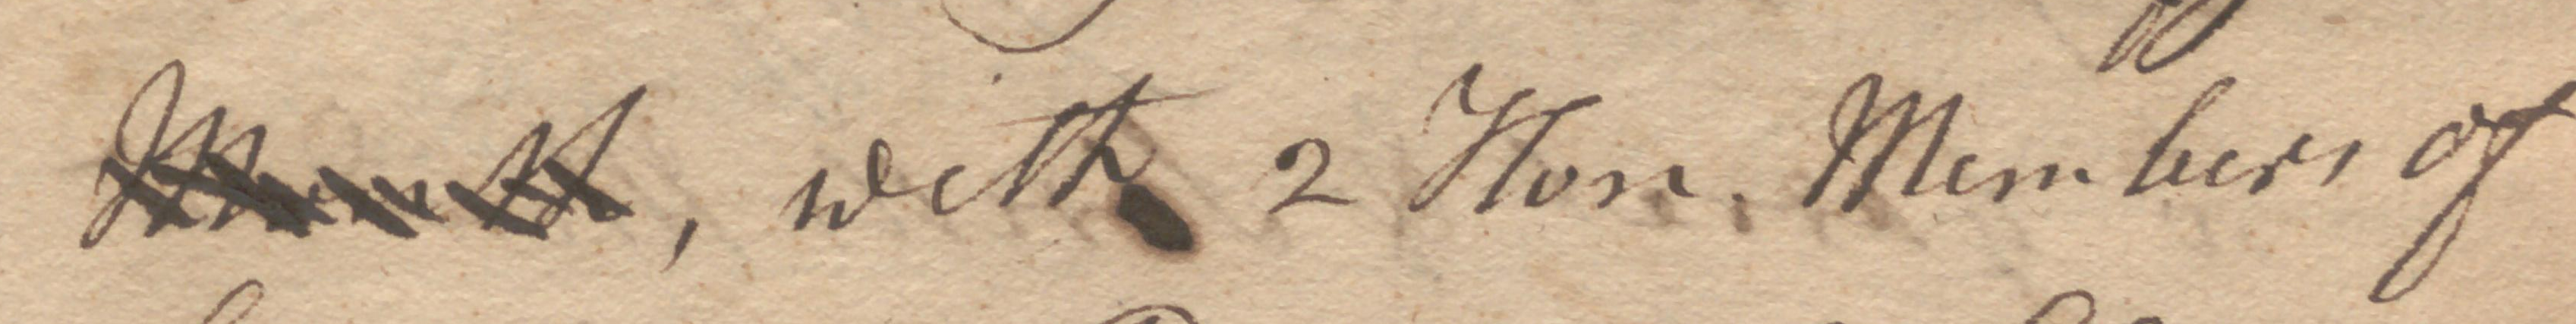[Month], with 2 Hon. Members of
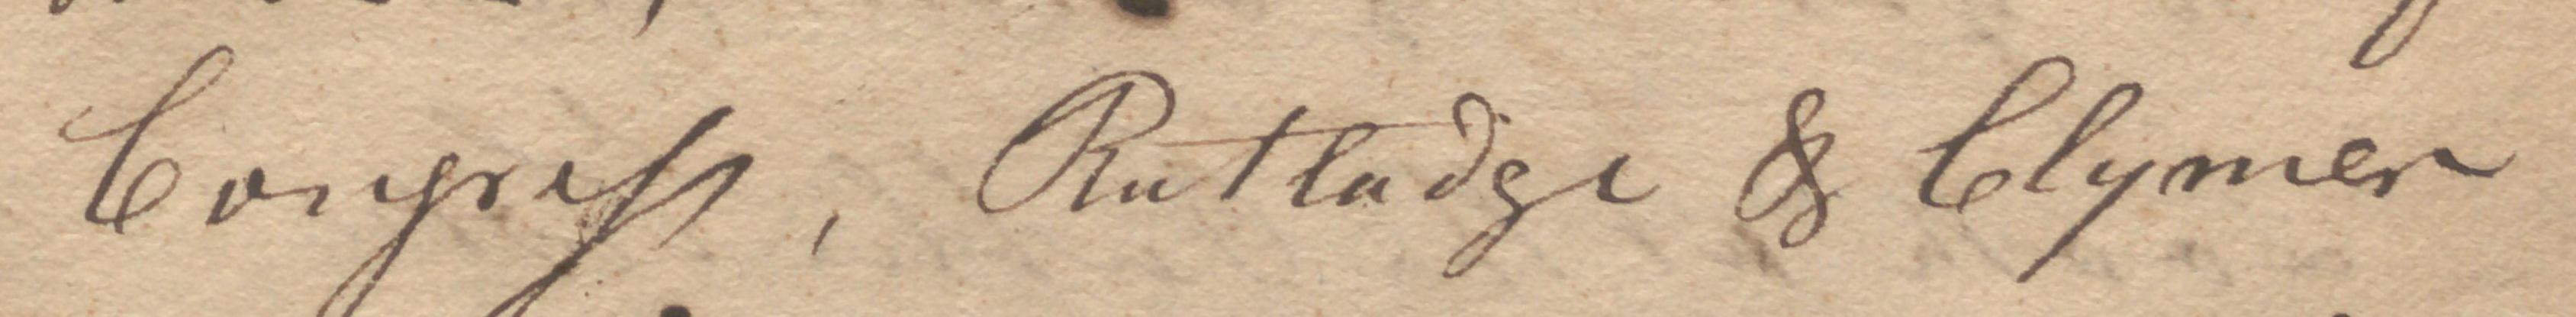Cougress. Rutladge & Clymer
